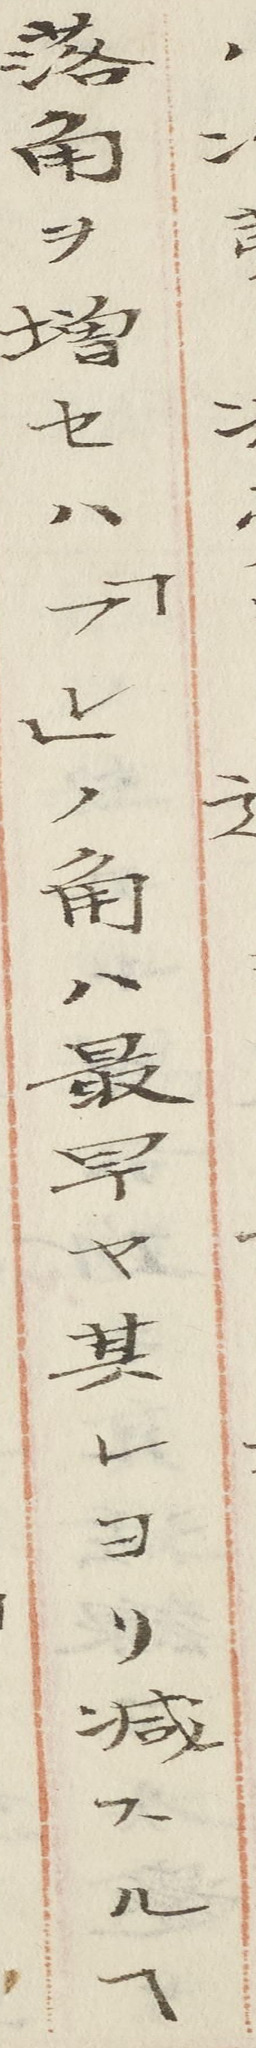落角ヲ増セハ「フレ」ノ角ハ最早ヤ其レヨリ減スルコト
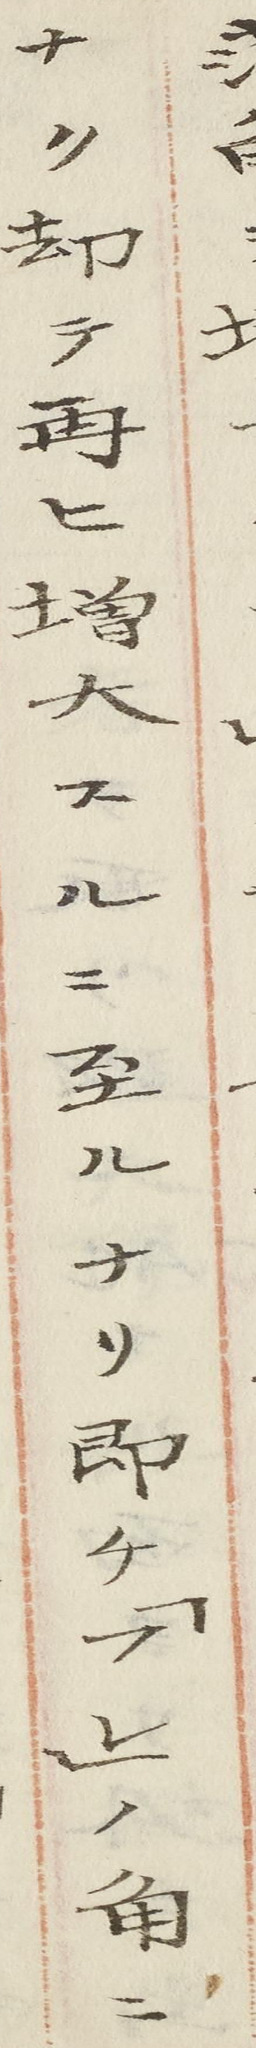ナク却テ再ヒ増大スルニ至ルナリ即チ「フレ」ノ角ニ
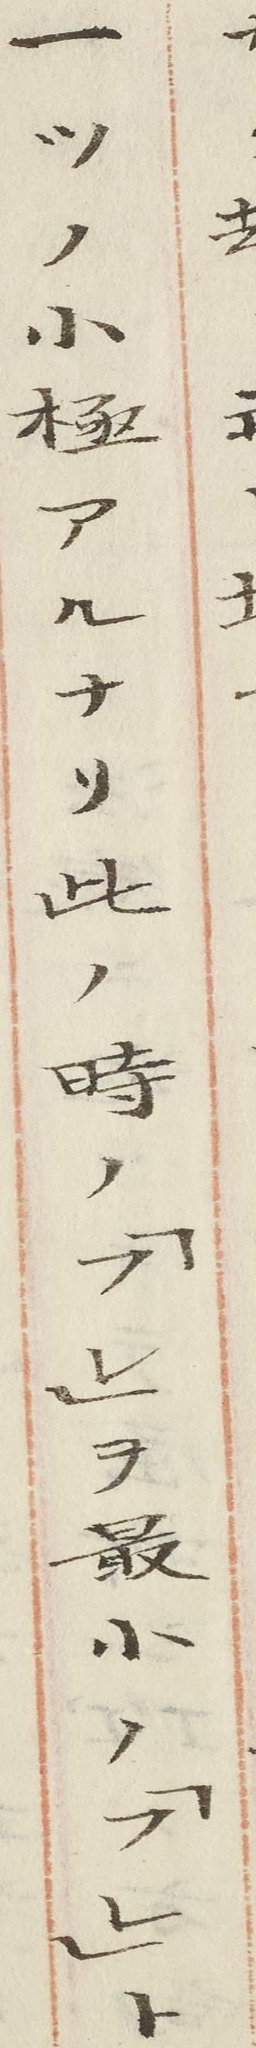一ツノ小極アルナリ此ノ時ノ「フレ」ヲ最小ノ「フレ」ト
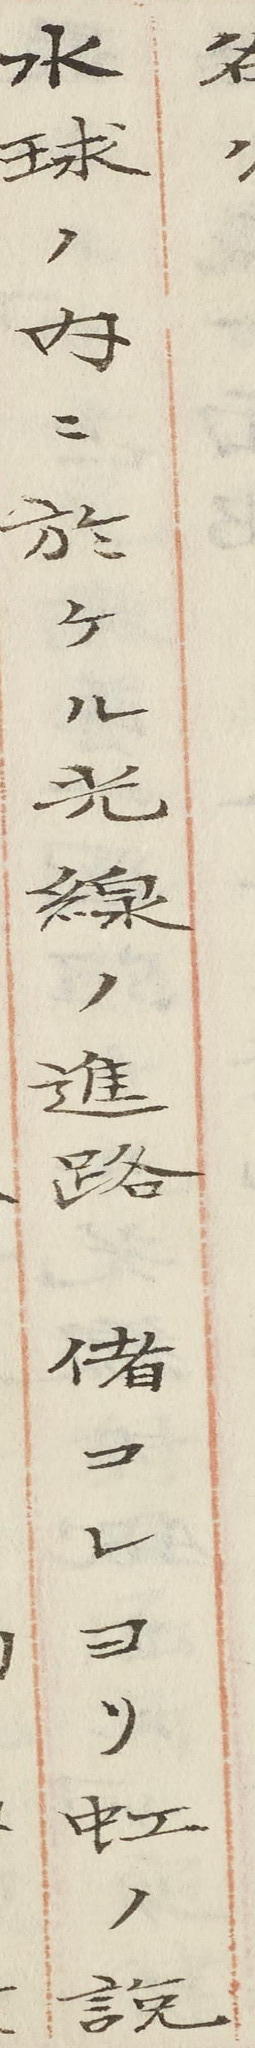水球ノ内ニ於ケル光線ノ進路偖コレヨリ虹ノ説
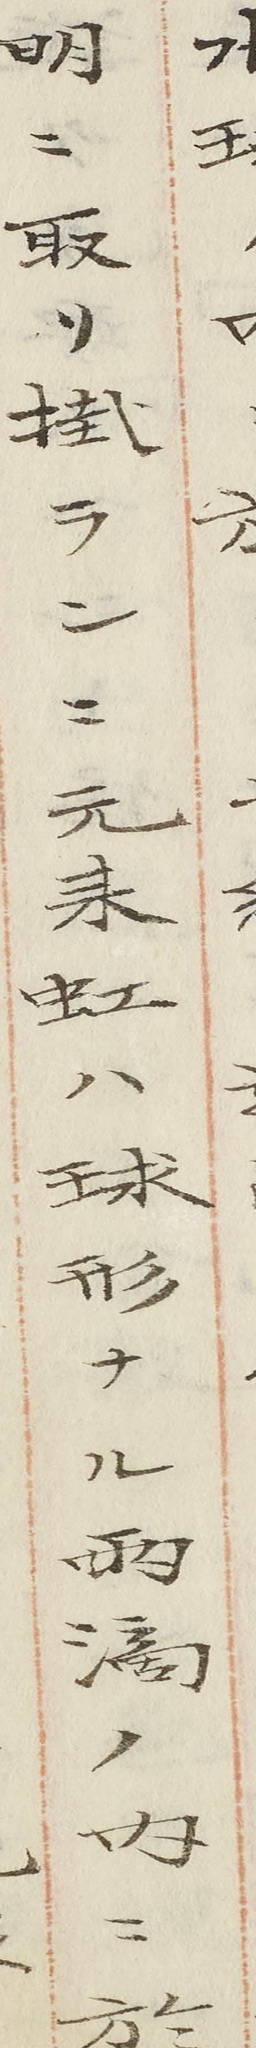明ニ取リ掛ランニ元来虹ハ球形ナル雨滴ノ内ニ於
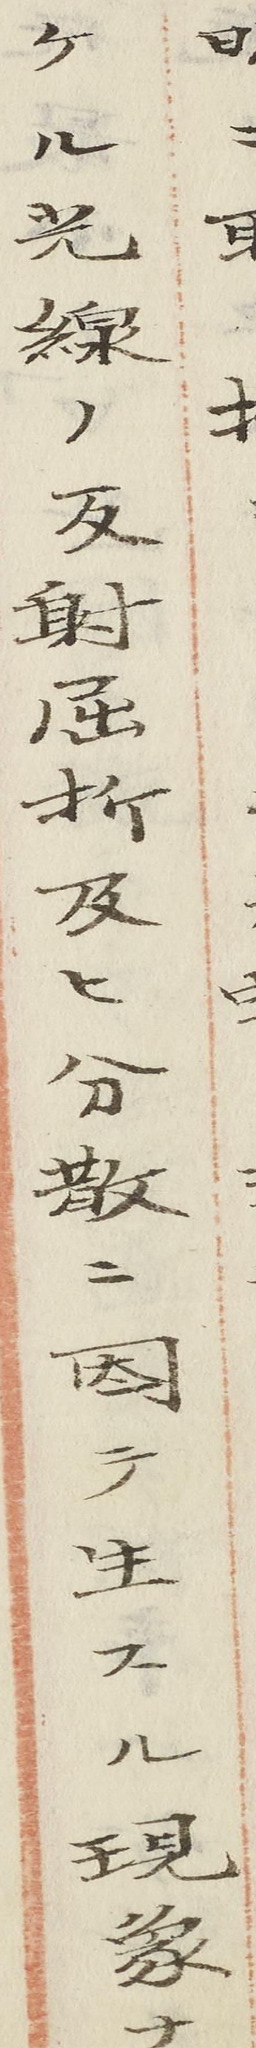ケル光線ノ反射屈折及ヒ分散ニ因テ生スル現象ナ
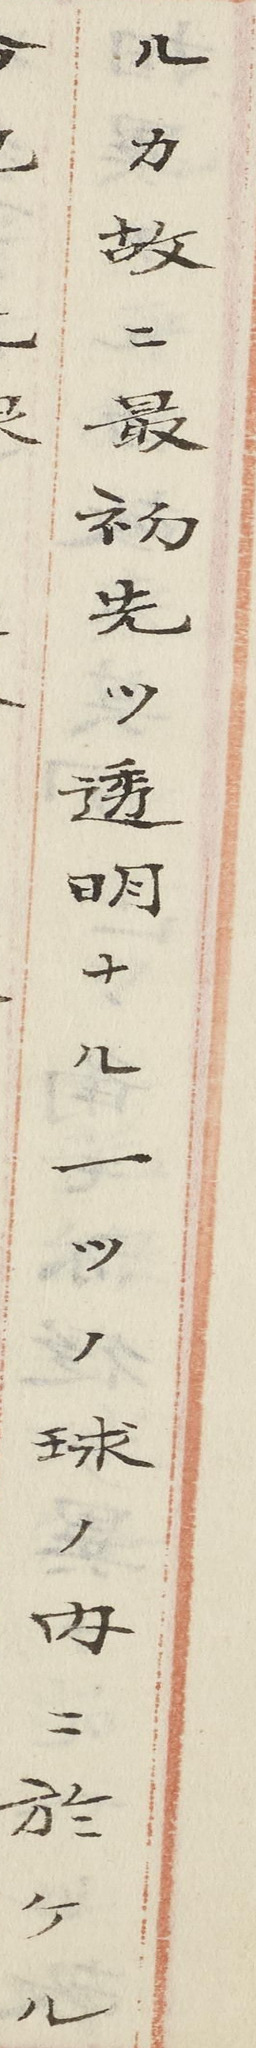ルカ故ニ最初先ツ透明ナル一ツノ球ノ内ニ於ケル
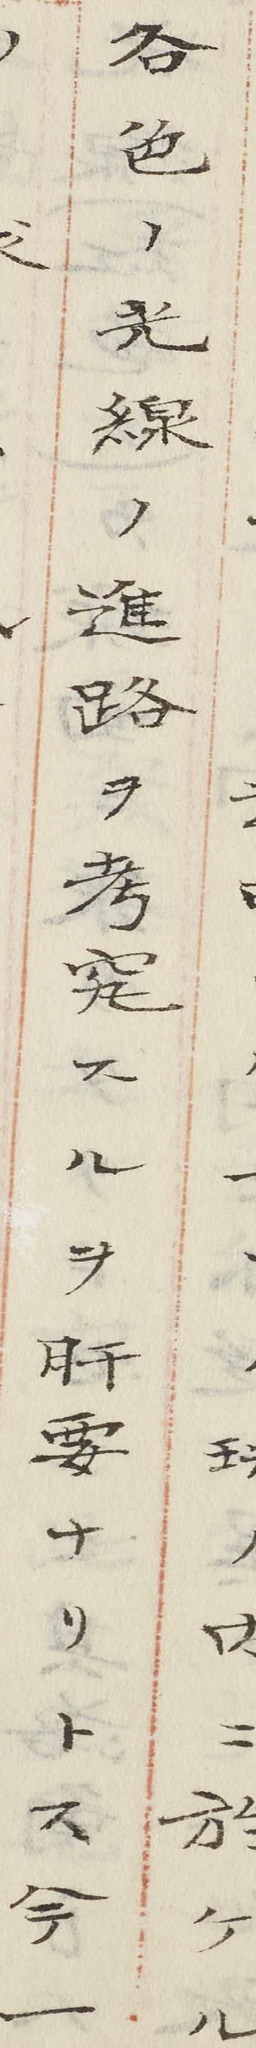各色ノ光線ノ進路ヲ考究スルヲ肝要ナリトス今一
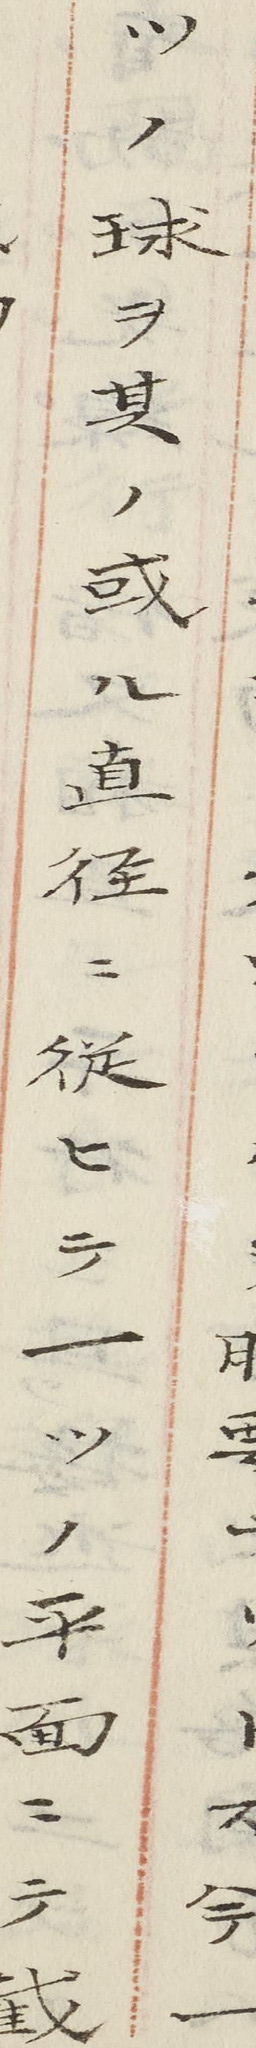ツノ球ヲ其ノ或ル直径ニ従ヒテ一ツノ平面ニテ截
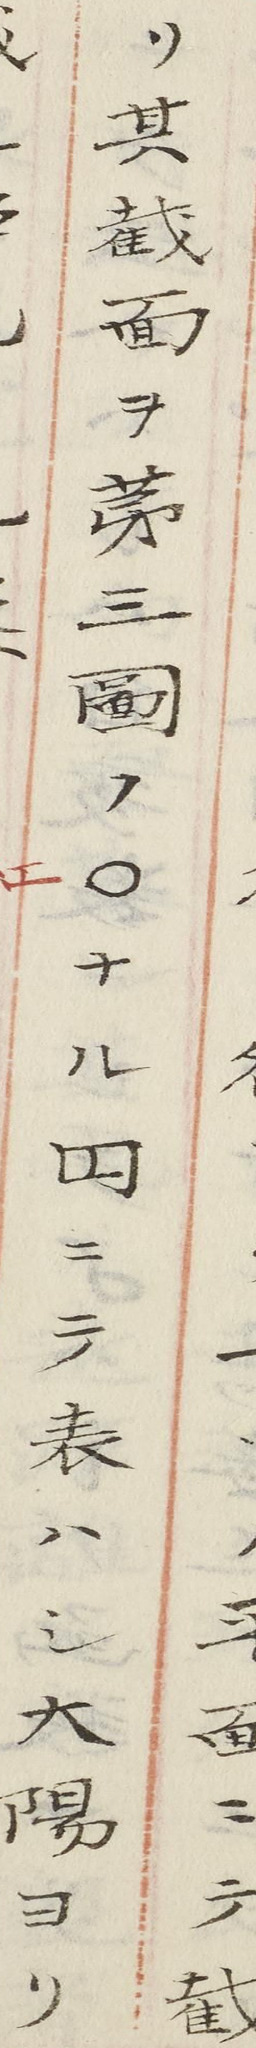リ其ノ截面ヲ第三図ノ〇ナル円ニテ表ハシ大陽ヨリ
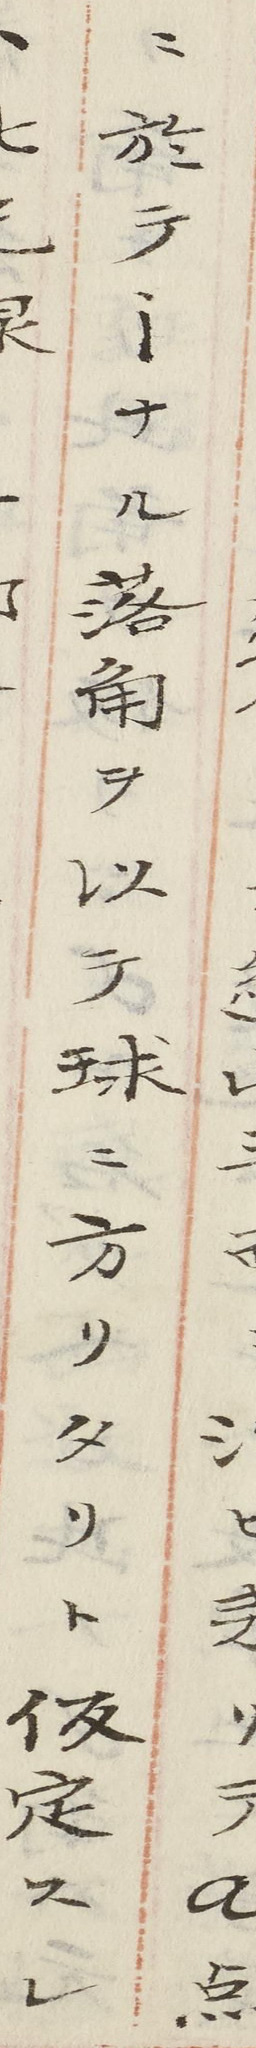ニ於テｉナル落角ヲ以テ球ニ方リタリト仮定スレ
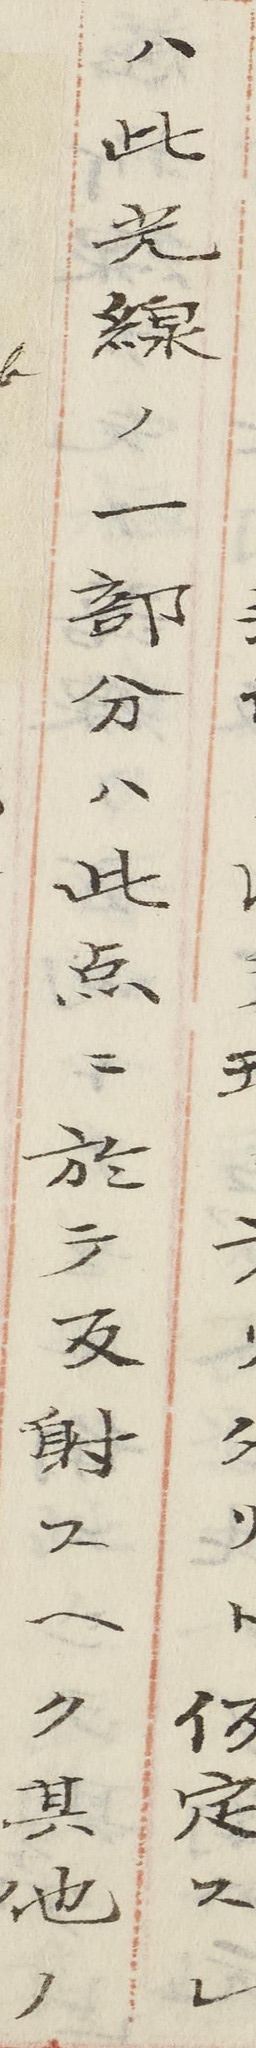ハ此光線ノ一部分ハ此点ニ於テ反射スヘク其他ノ
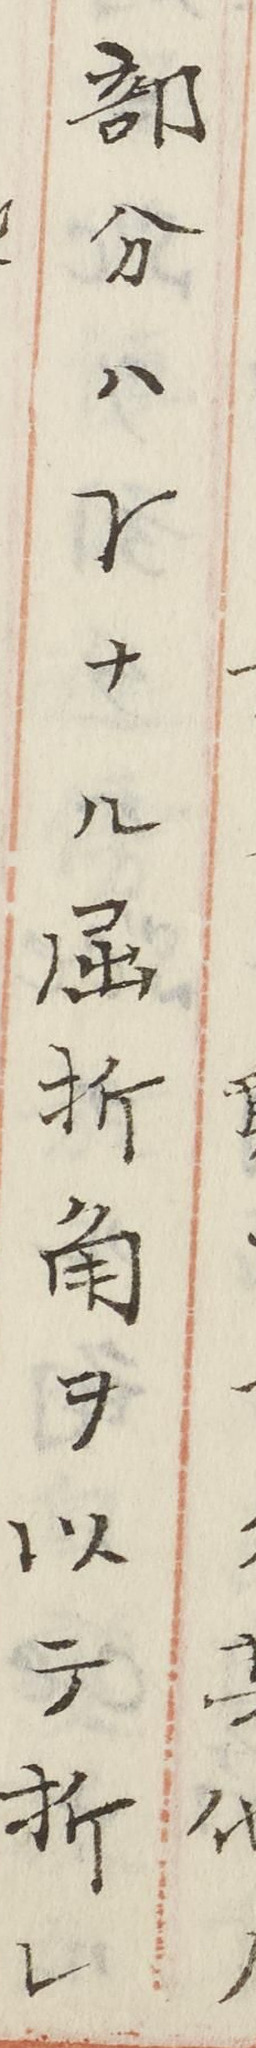部分ハｒナル屈折角ヲ以テ折レ
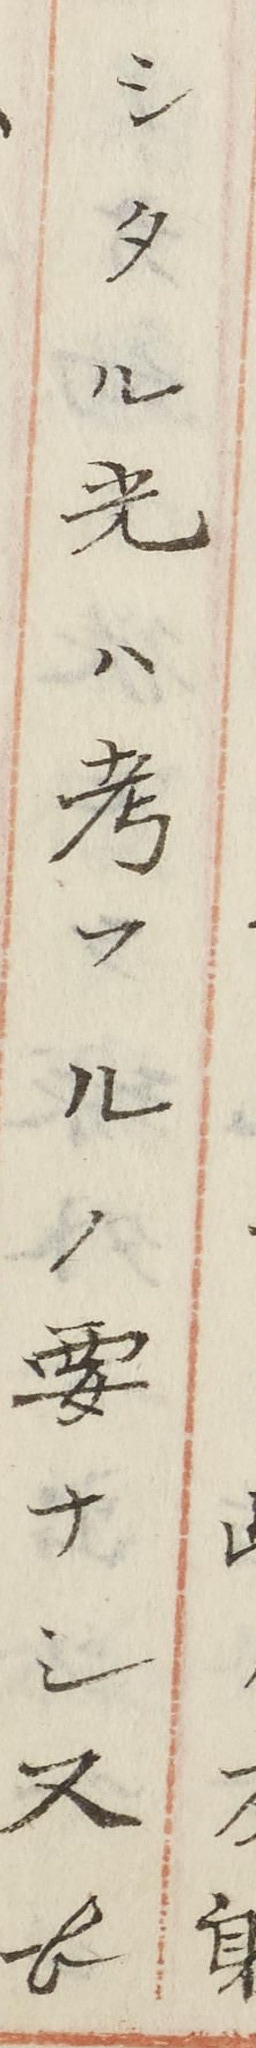三シタル光ハ考フルノ要ナシ又ｂ
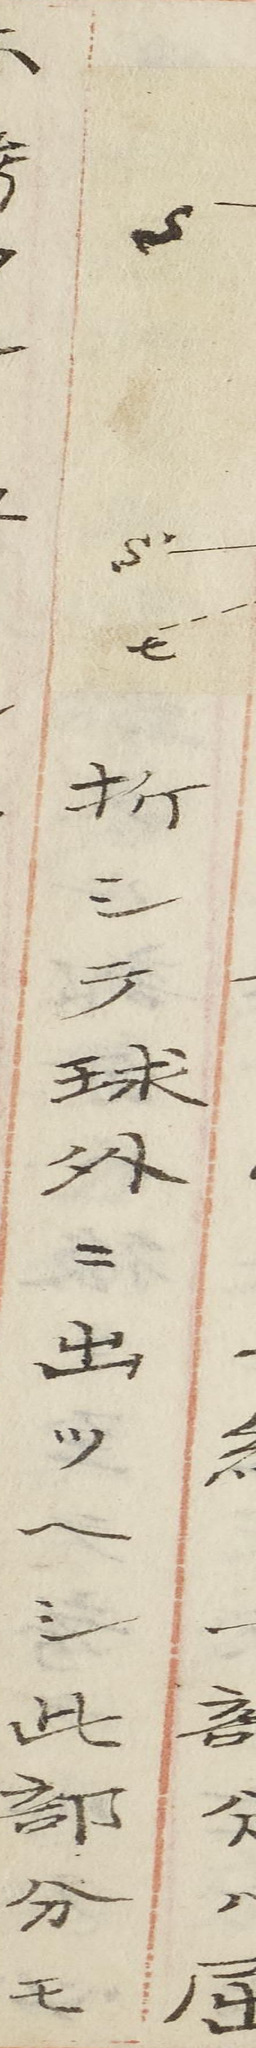折シテ球外ニ出ツヘシ此部分モ
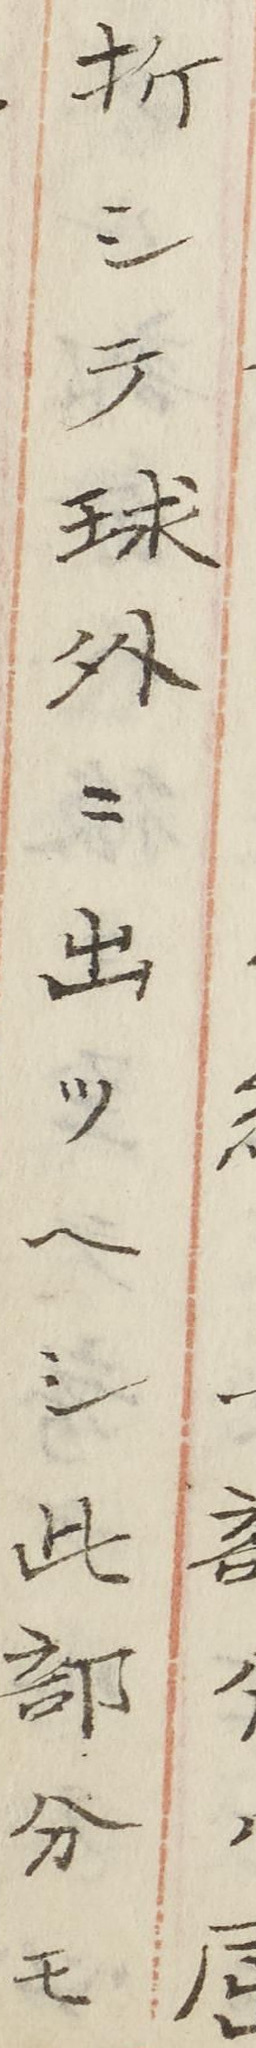折シテ球外ニ出ツヘシ此部分モ
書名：虹及ハロノ説明
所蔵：東京大学地震研究所図書室 Earthquake Research Institute Library, The University of Tokyo, JAPAN
